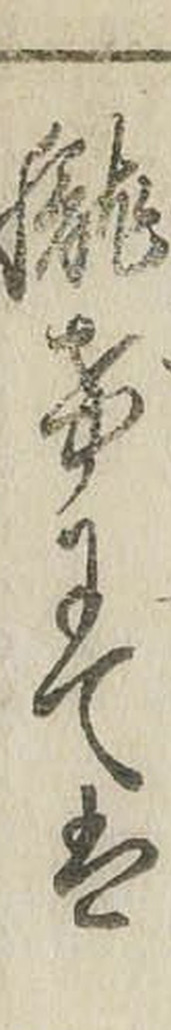朧げにては
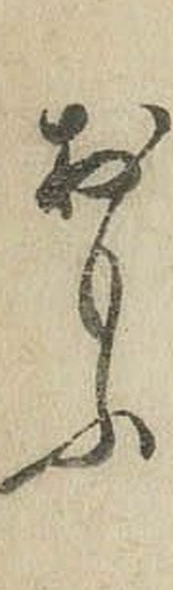おもふ

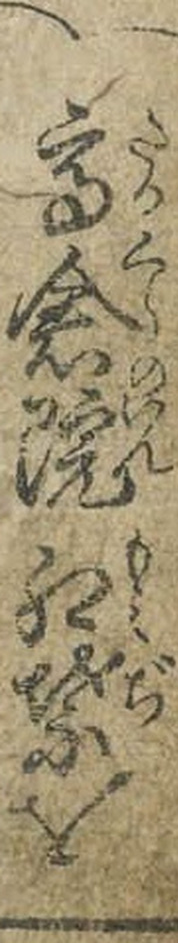高倉院紅葉を
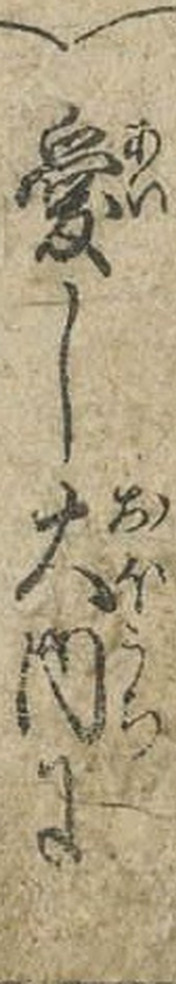愛し大内に
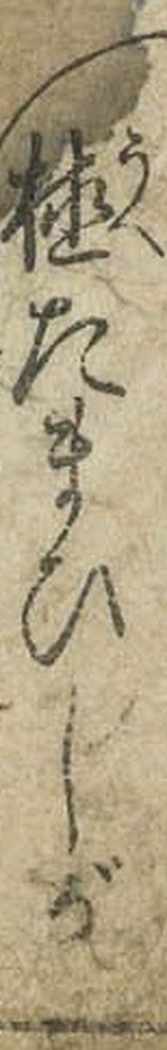植たまひしが
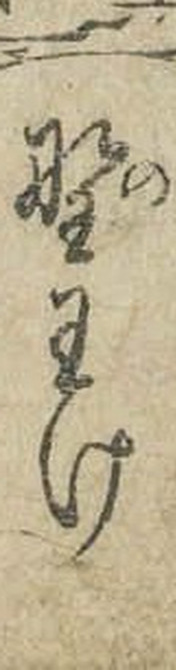野わけ
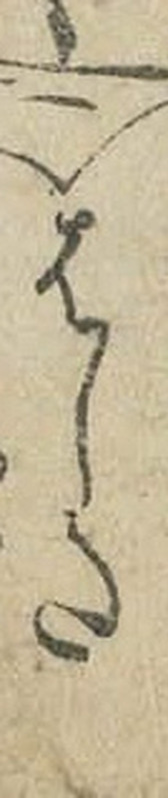はした
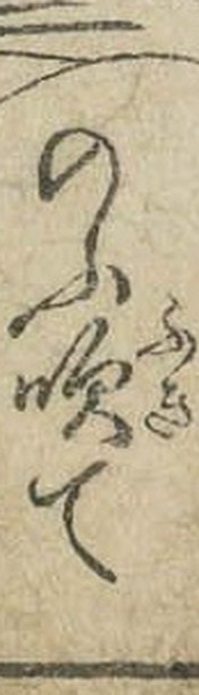のふ吹て
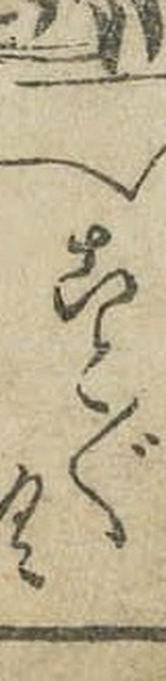こと〴〵く
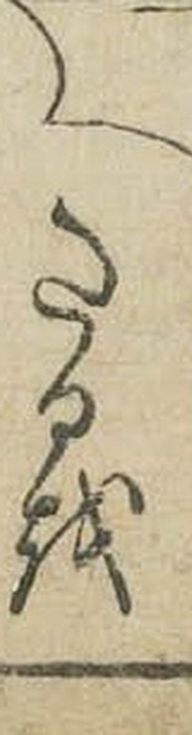たるを
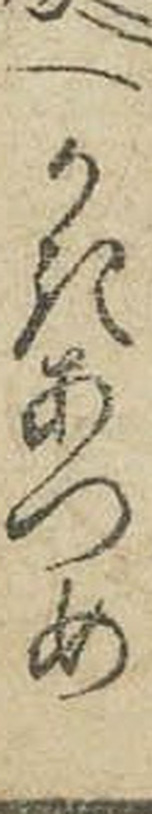かきあつめ
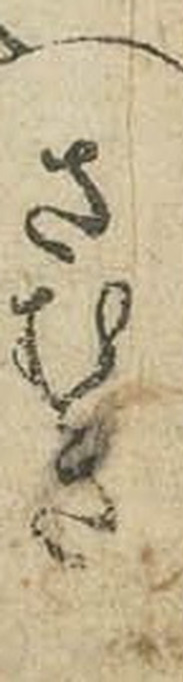さむき
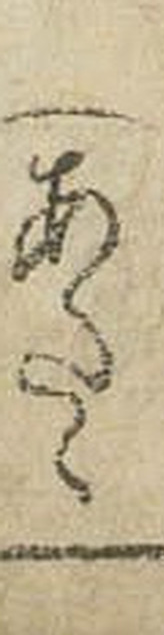あたゝ
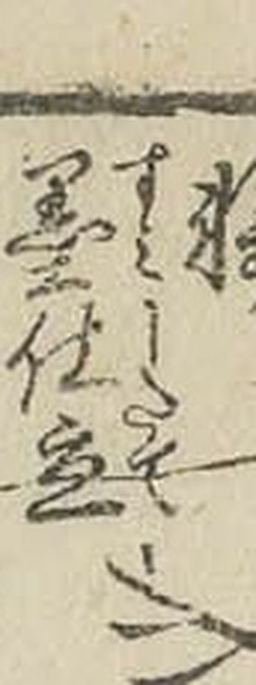墨仕立
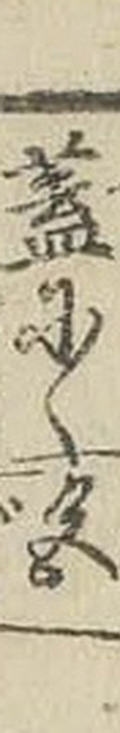蓋にゝ色
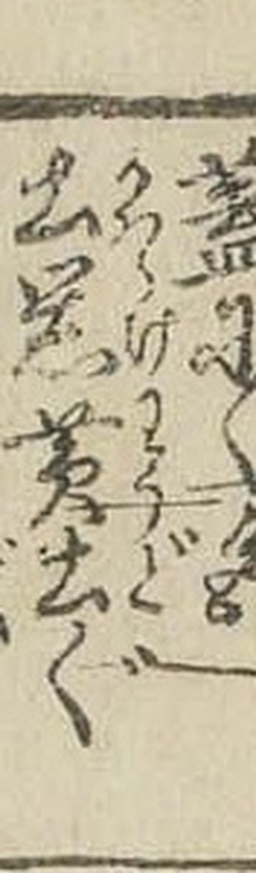土器黄土ぐ
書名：絵本写宝袋 9巻 1之巻
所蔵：東京学芸大学教育コンテンツアーカイブ
